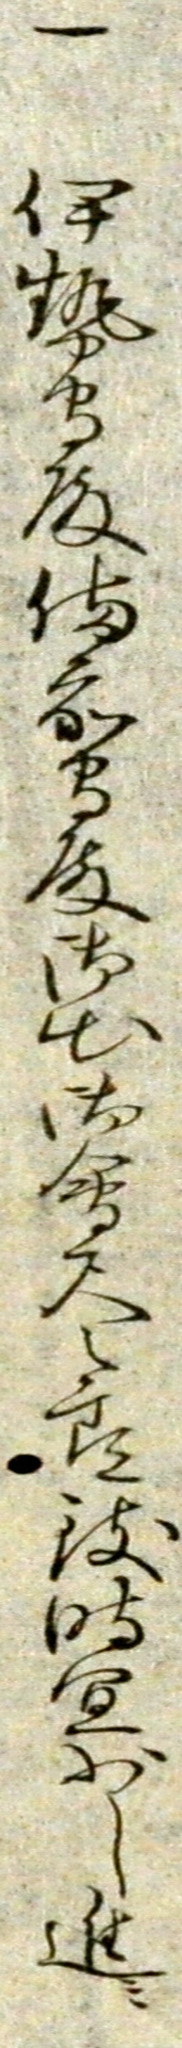一伊勢守殿備前守殿御出御会尺之節時宜少し進ミ
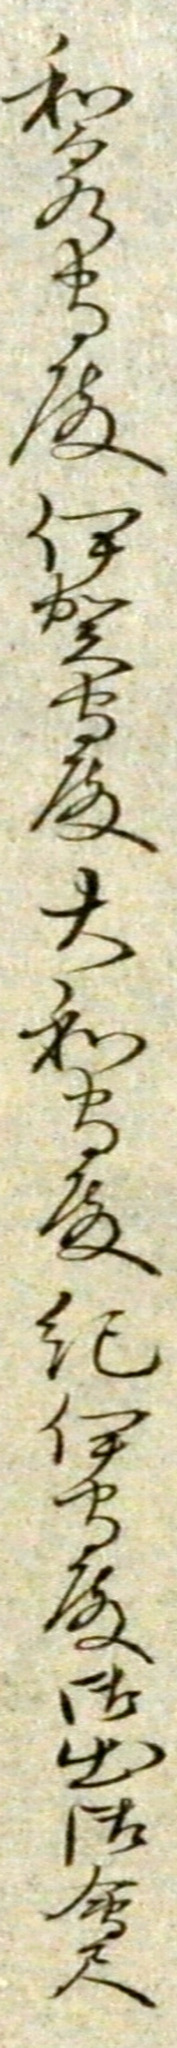和泉守殿伊賀守殿大和守殿紀伊守殿御出御会尺
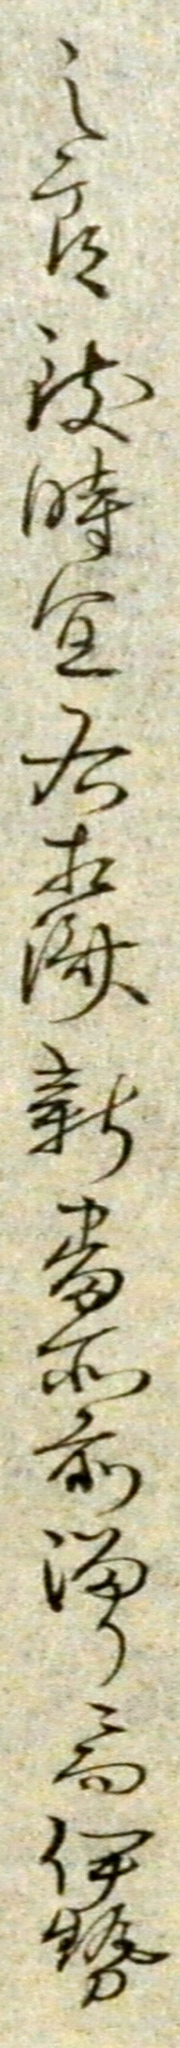之節致時宜右相済新番所前溜りニ而伊勢
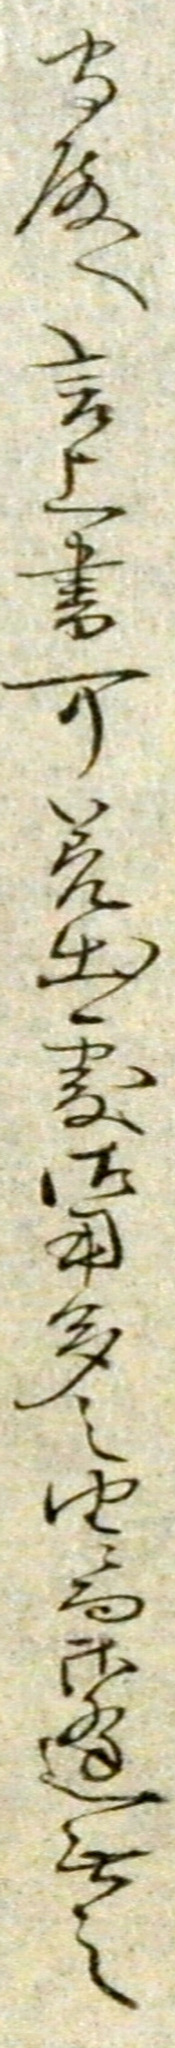守殿ヘ言上書可差出處御用多之由ニ而御逢無之
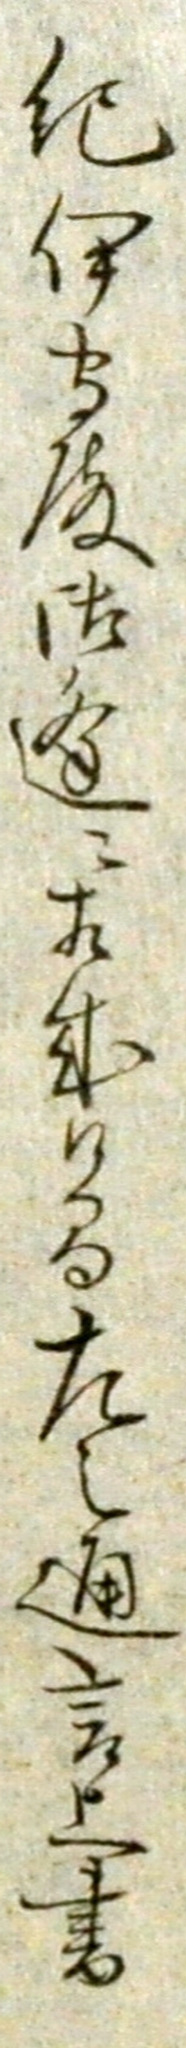紀伊守殿御逢ニ相成候間左之通言上書

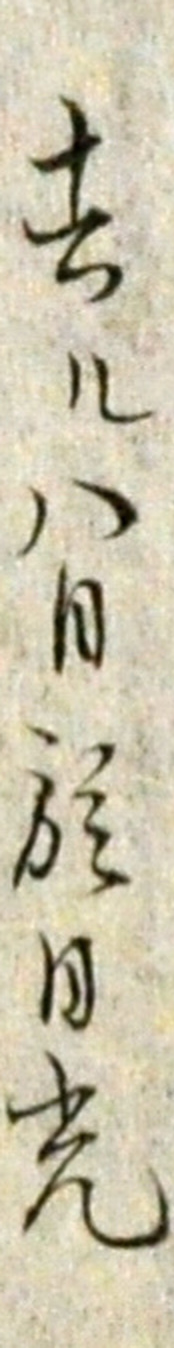去ル八日於日光
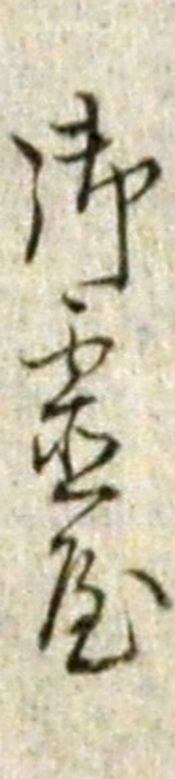御霊屋
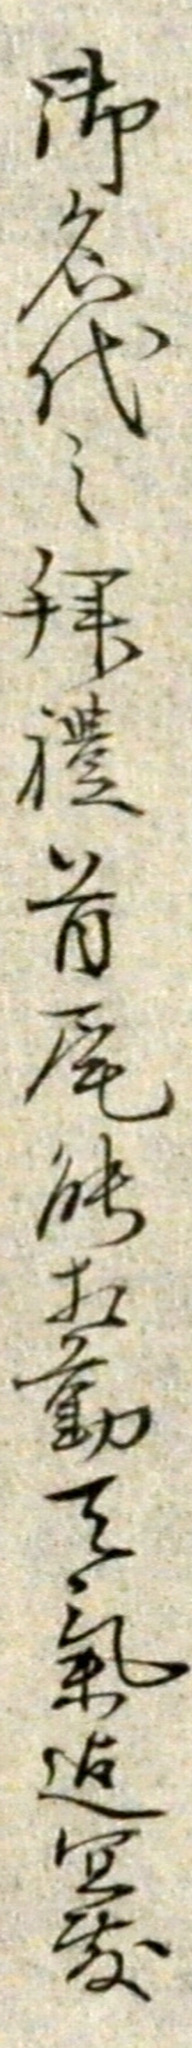御名代之拝礼首尾能相勤天気迄宜敷
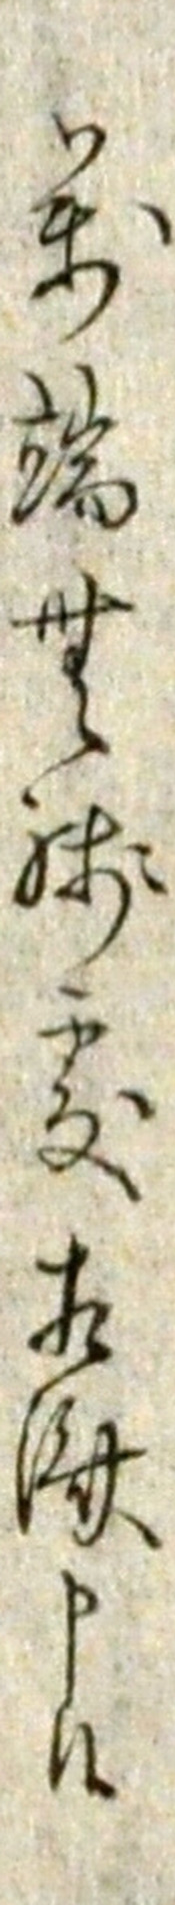万端無残処相済申候
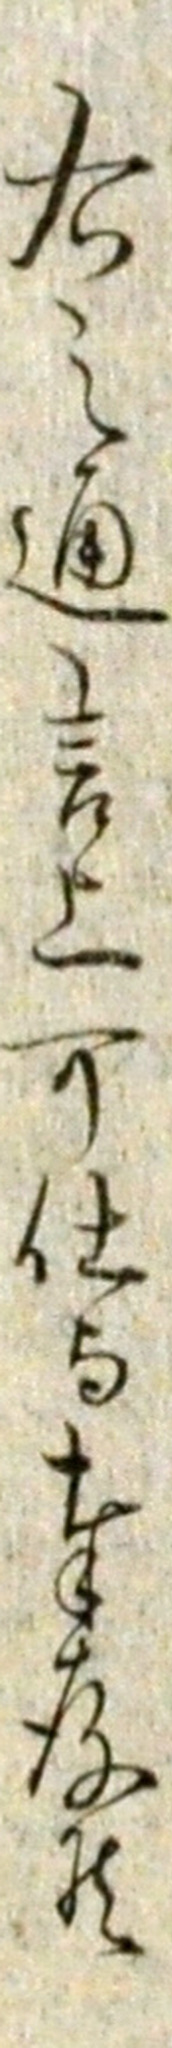右之通言上可仕と奉存候
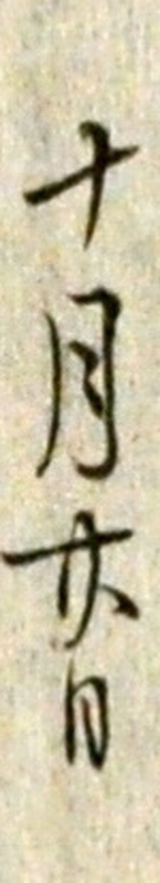十月廿日
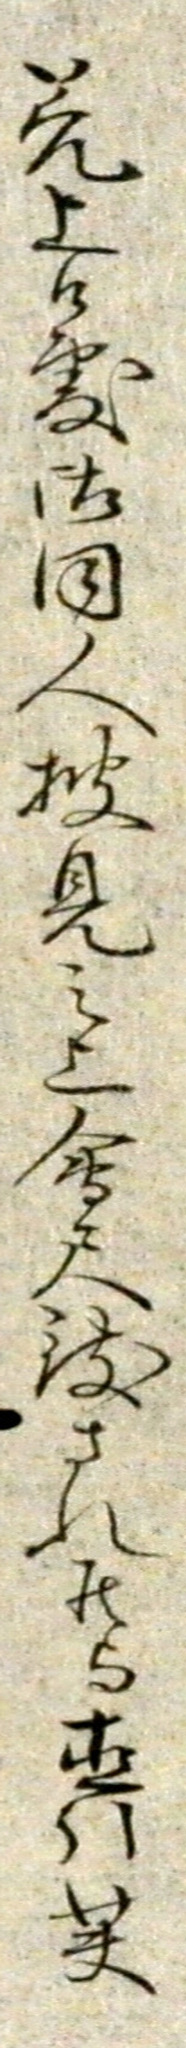差上候処御同人披見之上会尺致され候と直引芙
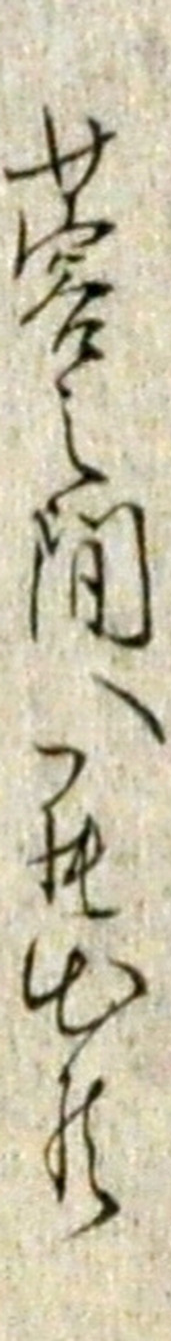蓉之間へ罷出候
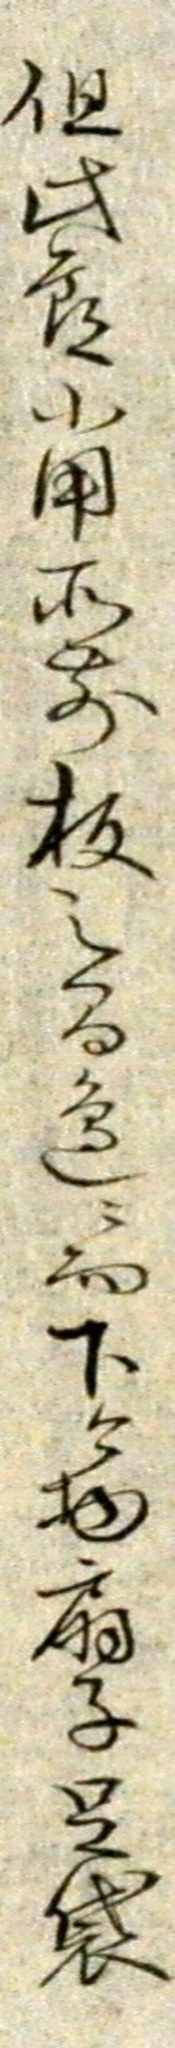但此節小用所前板之間辺ニ而下々物扇子足袋
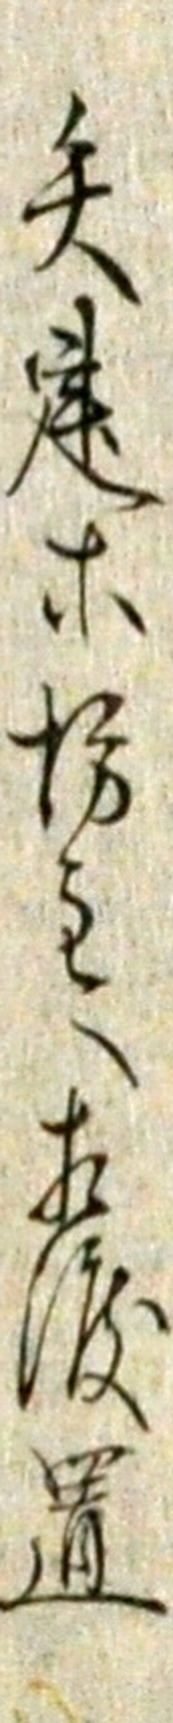矢建等坊主へ相渡置
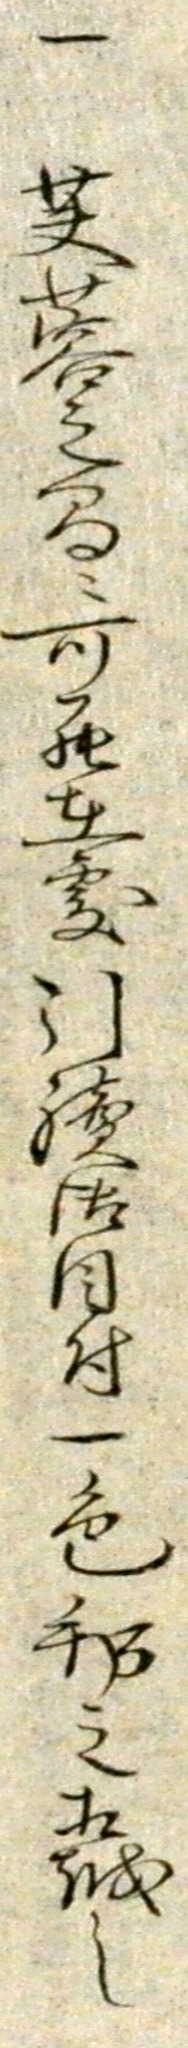一芙蓉之間ニ可罷在処引続御目付一色邦之相越し
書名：日光御名代相勤候節ノ留
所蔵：伊那市立高遠町図書館・合同会社AMANE
